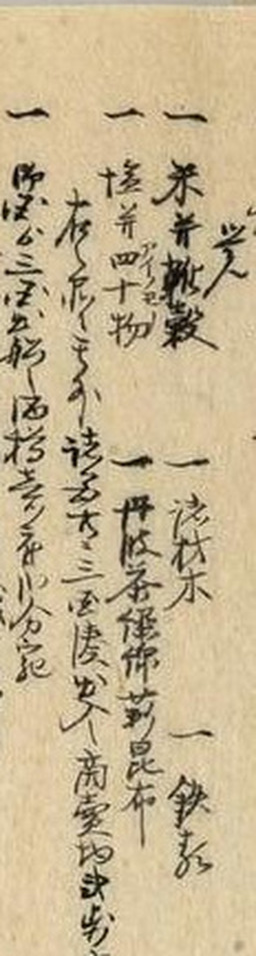一塩幷四十物一丹波茶繰綿薪昆布
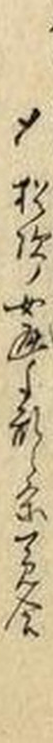〆猶次ノ女通手形之条可見合
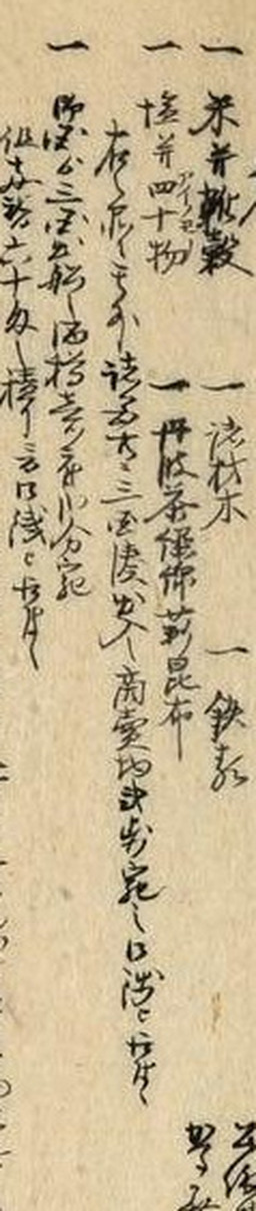右之品々其外諸色共ニ三国湊出入之商売物弐歩宛之口銭被仰付候
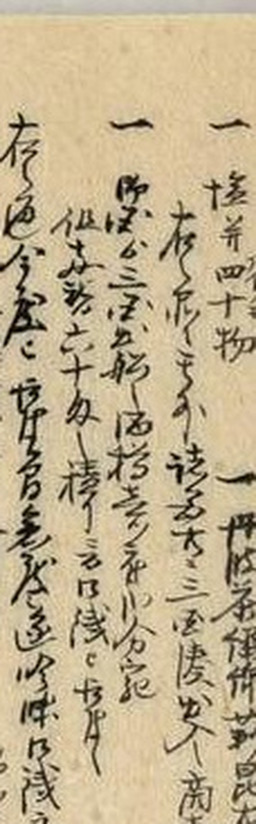一御国ゟ三国出船之酒樽壱ツニ付二分宛
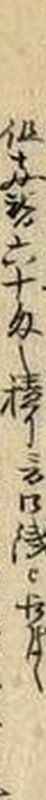但両替六十匁之積りニ而口銭被仰付候
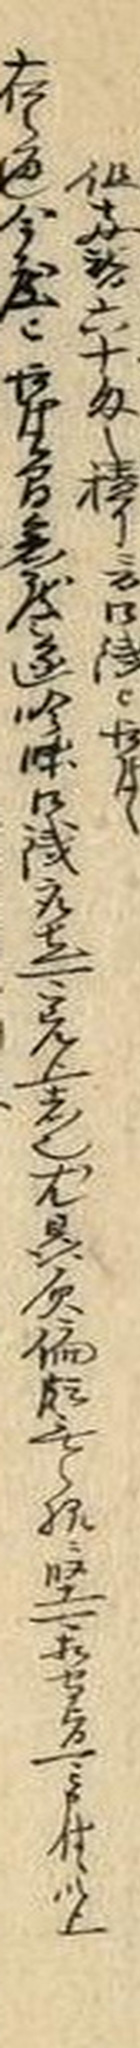右之通今度被仰付候間急度遂吟味口銭取立可差上者也尤贔屓偏頗無之様ニ堅可相守旨可被仰付候以上
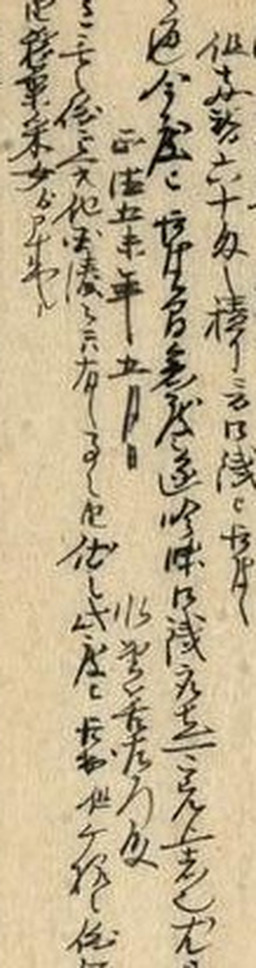正徳五未年五月日水野善左衛門殿
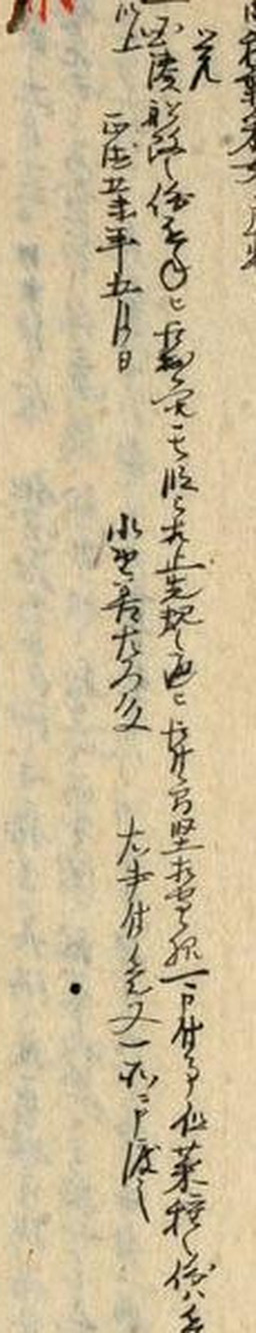候以上正徳五未年五月日水野善左衛門殿右書付之覚又一所ニ申渡之

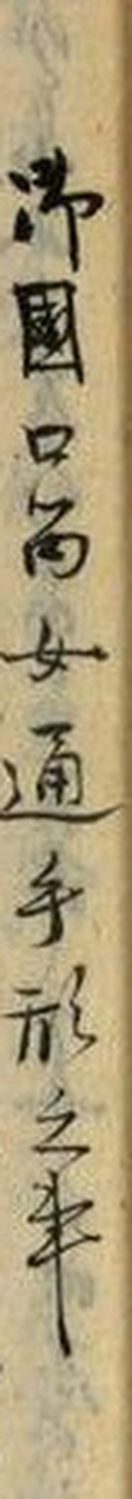御国口留女通手形之事
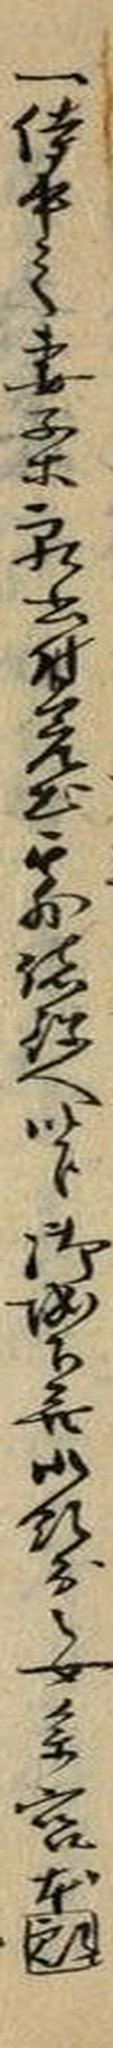一侍中之妻子等願書付差出其外諸役人以下御城下幷御領分之女参宮本願
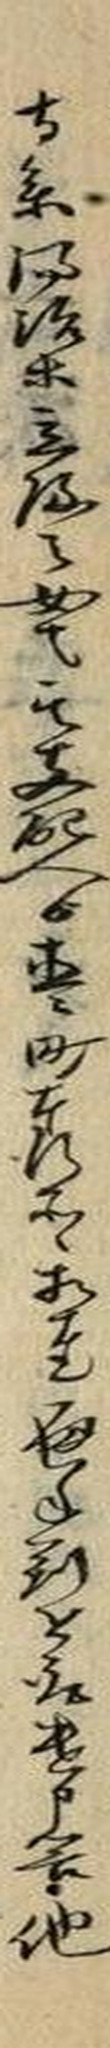寺参湯治等立帰之女者其支配人ゟ直々町奉行所へ相達通手形を取遣申筈他
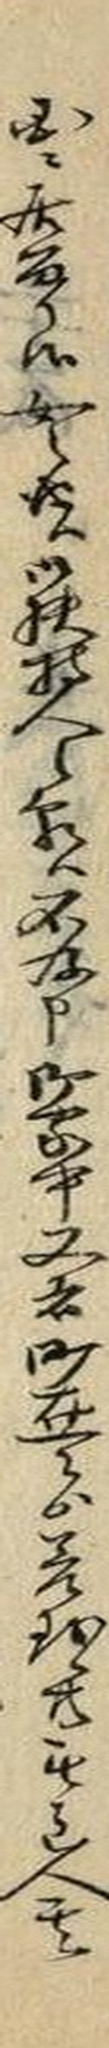国ニ居留り候女之儀ハ御扶持人之願ハ不及申御家中又者町在々ゟ差越候共其主人其
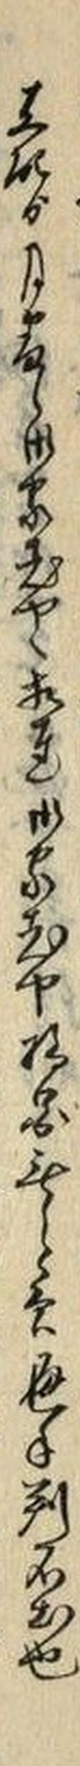支配ゟ月番之御家老中へ相達御家老中指図無之候而ハ通手形不出也
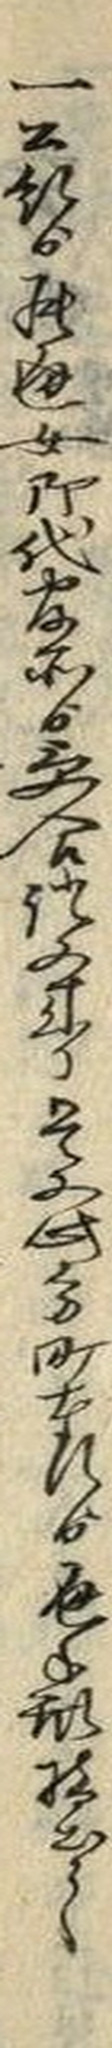一公領ゟ罷通女御代官所ゟ受合証文来り是又此方町奉行ゟ通手形指出之
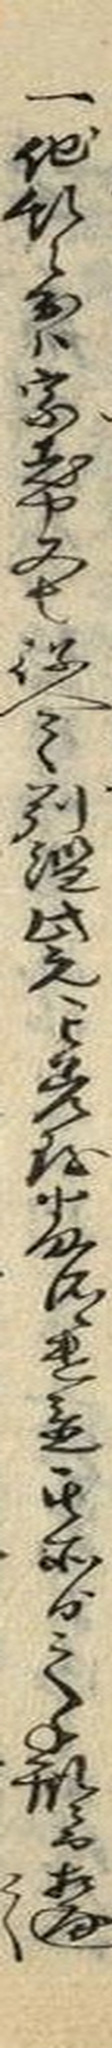一他領之分ハ家老中又者役人之判鑑此元へ被差越番所へ遣置其所ゟ之手形ニ而相通之
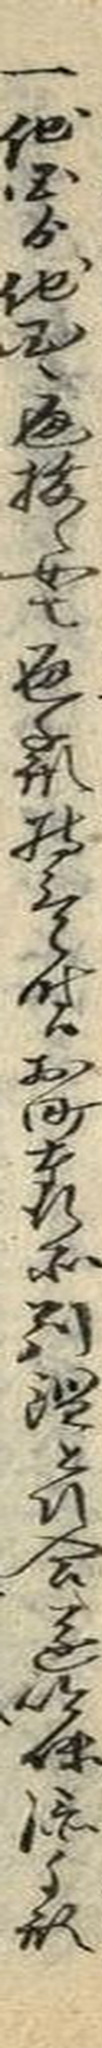一他国ゟ他国へ通抜候女者通手形持参之時ハ於町奉行所判鑑と引合遂吟味手形
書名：御国他国諸事之部
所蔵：福井県文書館 Fukui Prefectural Archives
